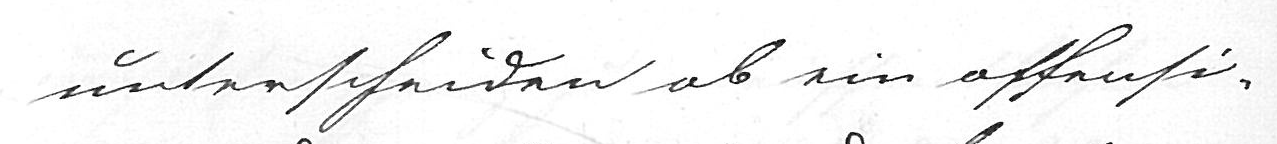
unterscheiden ob ein offensi-
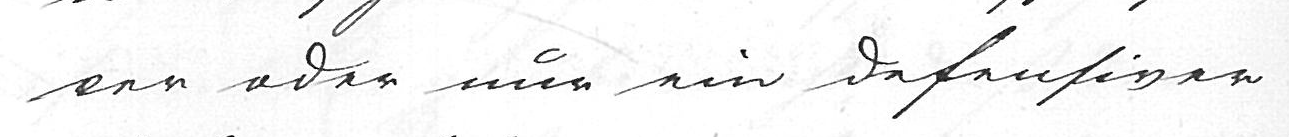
ver oder nur ein defensiver
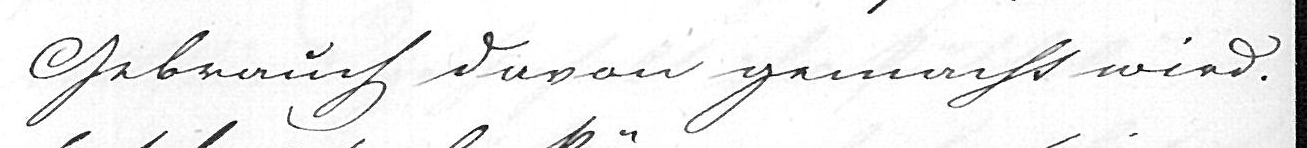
Gebrauch davon gemacht wird.
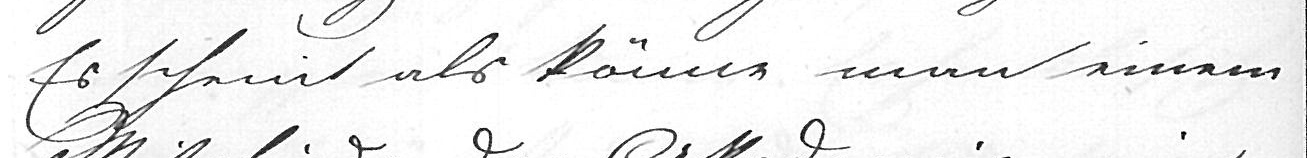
Es scheint als könne man einem
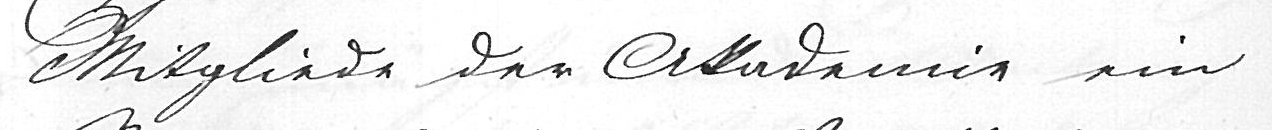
Mitgliede der Akademie ein
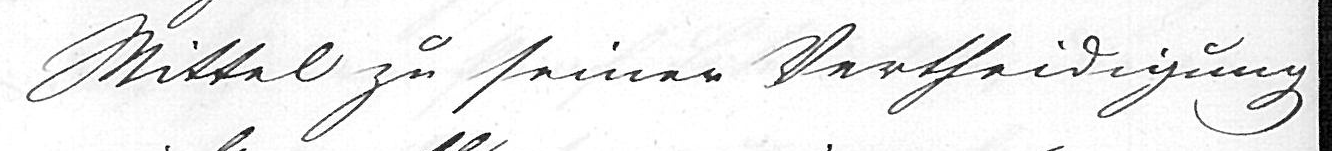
Mittel zu seiner Vertheidigung
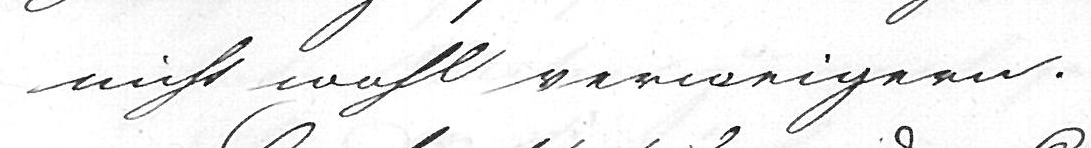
nicht wohl verweigern.
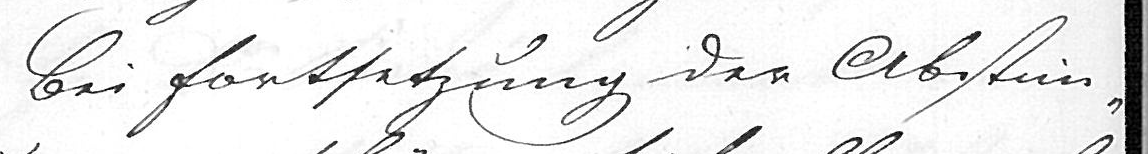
Bei Fortsetzung der Abstim-
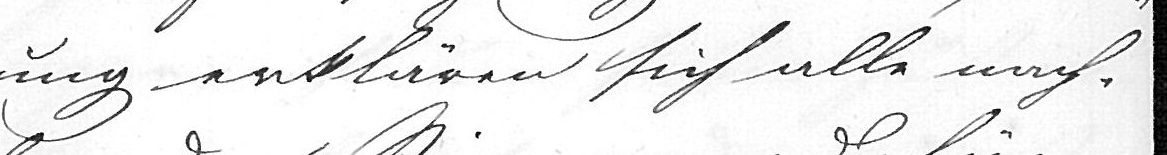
ung erklären sich alle nach-
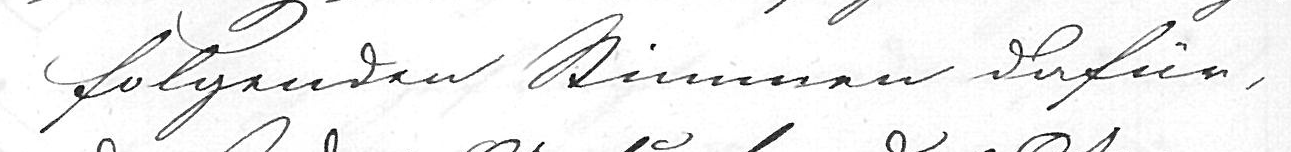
folgenden Stimmen dafür,
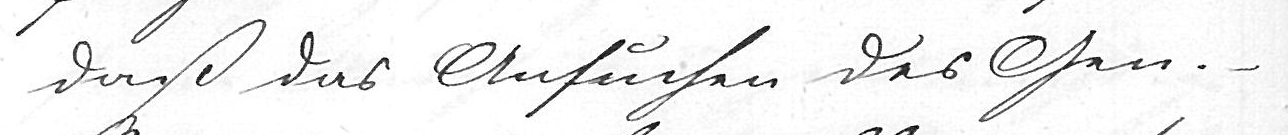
daß das Ansuchen des Gen.-
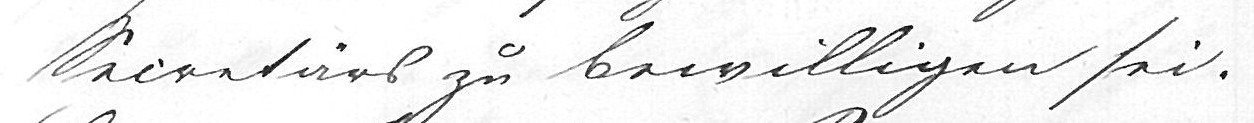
Secretärs zu bewilligen sei.
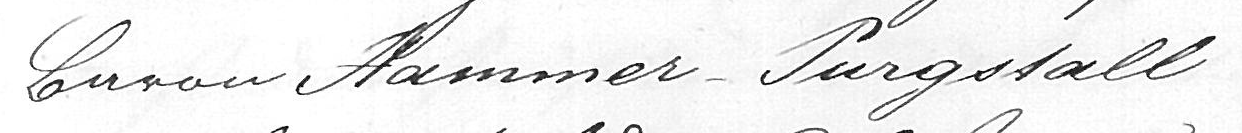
Baron Hammer-Purgstall
